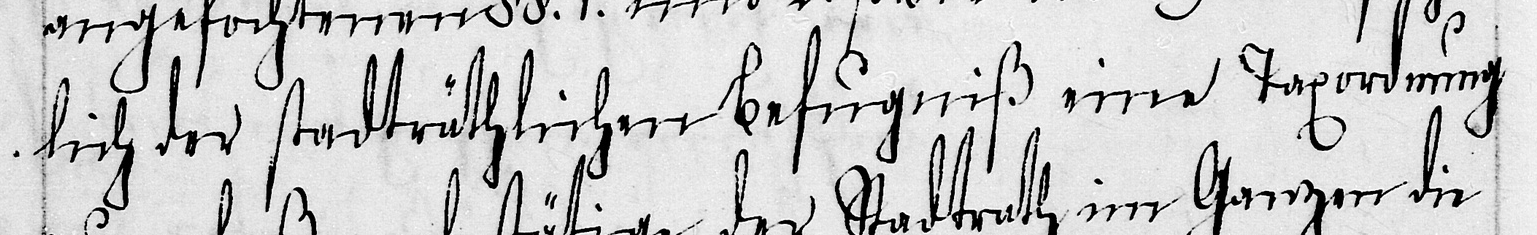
lich der stadträthlichen Befugniß eine Taxordnung
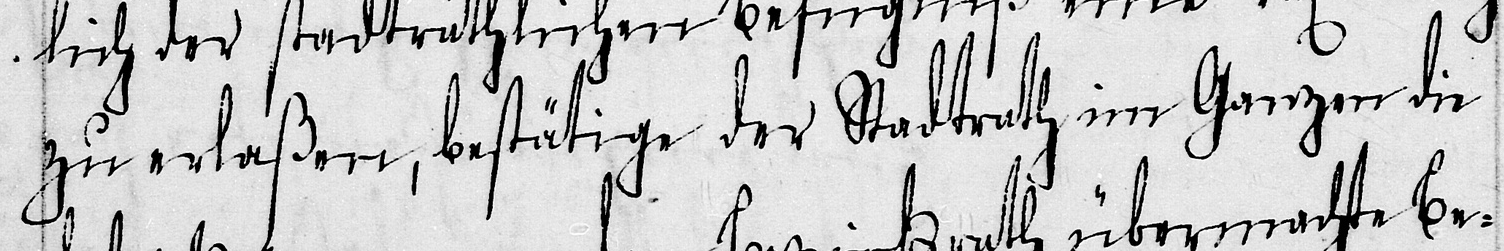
zu erlaßen, bestätige der Stadtrath im Ganzen die
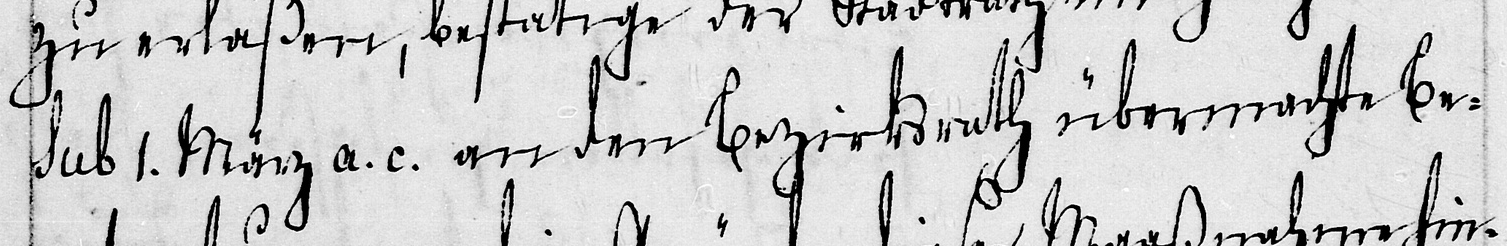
sub 1. März a. c. an den Bezirksrath übermachte Be¬
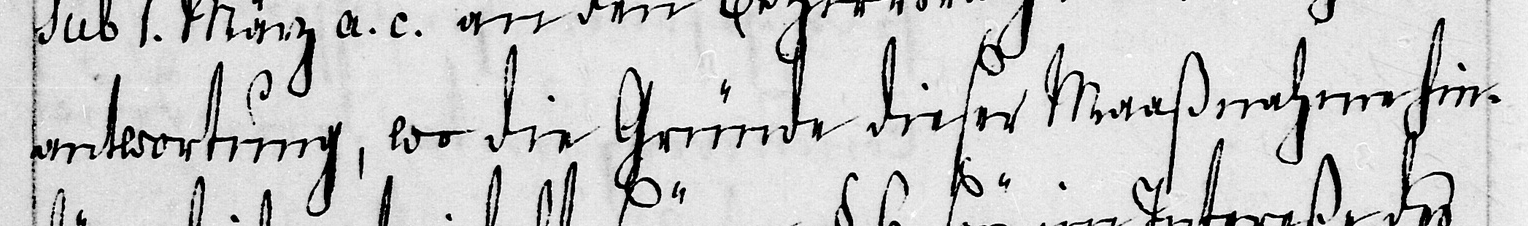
antwortung, wo die Gründe dieser Maaßnahme hin¬
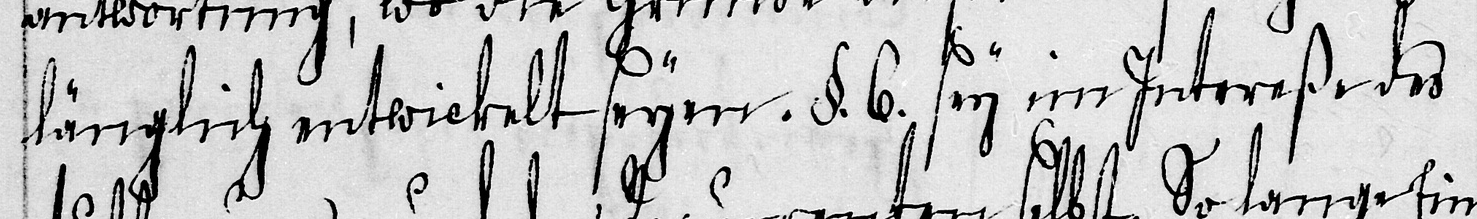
länglich entwickelt seyen. §. 6. sey im Intereße des
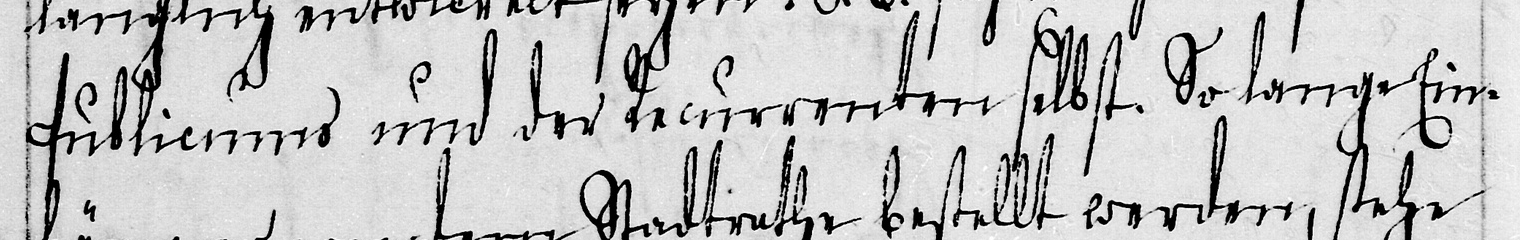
Publicums und der Recurrenten selbst. So lange Ein¬
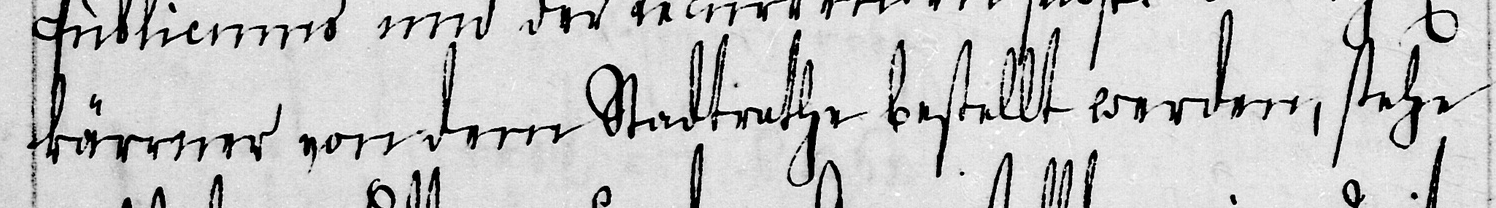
kärrner von dem Stadtrathe bestellt werden, stehe
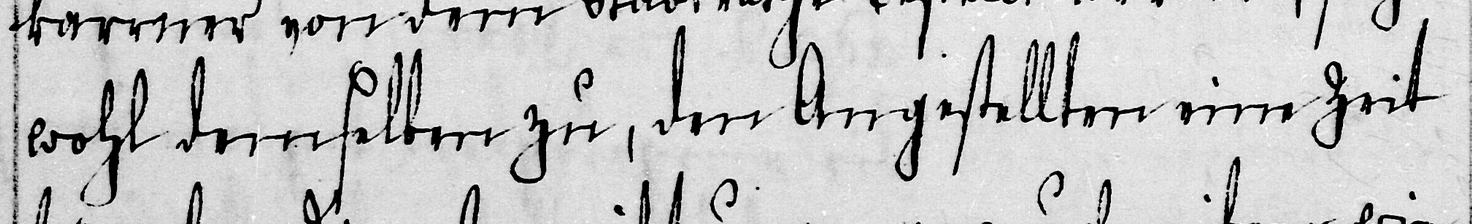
wohl demselben zu, den Angestellten eine Zeit
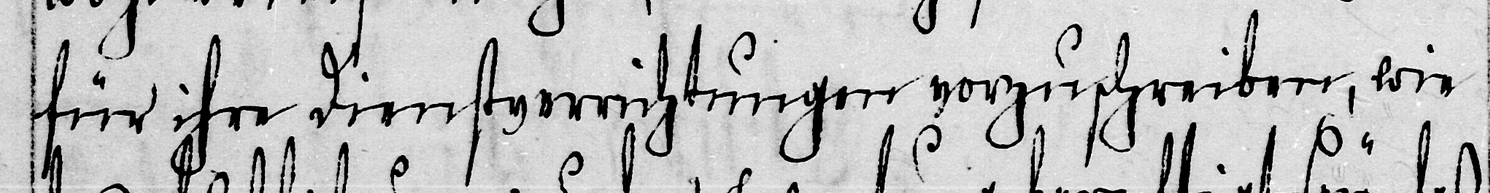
für ihre Dienstverrichtungen vorzuschreiben, wie
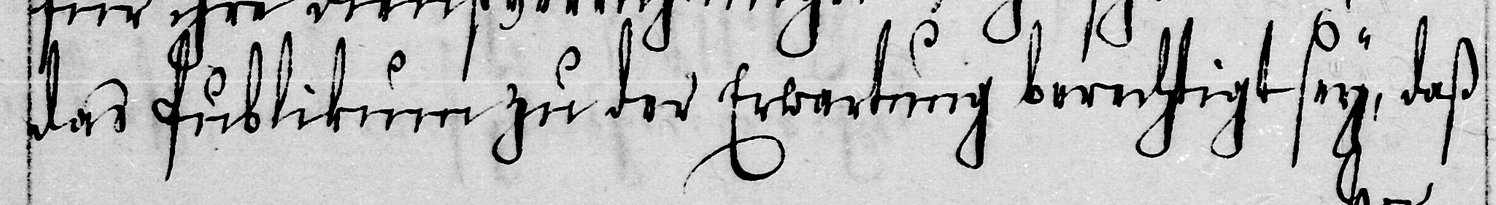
das Publikum zu der Erwartung berechtigt sey, daß
